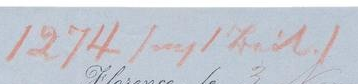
dans le Royaume
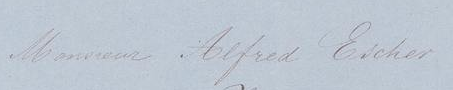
Monsieur Alfred Escher
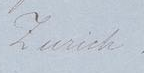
Zurich.
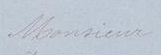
Monsieur
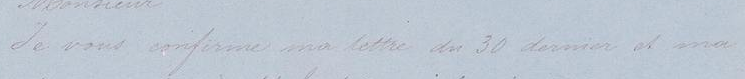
Je vous confirme ma lettre du 30 dernier et ma
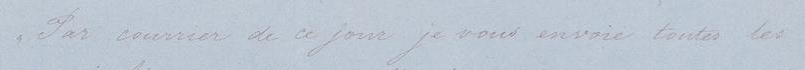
«Par courrier de ce jour je vous envoie toutes les
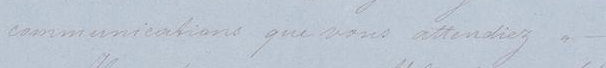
communications que vous attendiez» –.
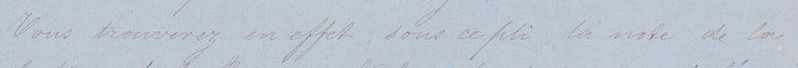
Vous trouverez en effet, sous ce pli, la note de la
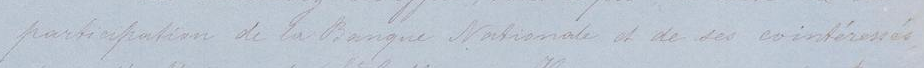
participation de la Banque Nationale et de ses cointéressés,
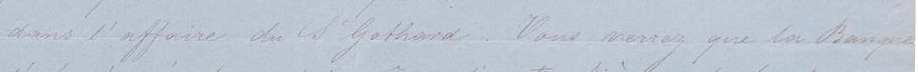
dans l'affaire du St Gothard. Vous verrez que la Banque
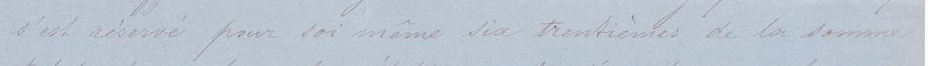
s'est réservé pour soi même six trentièmes de la somme
